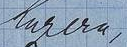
Luzern,
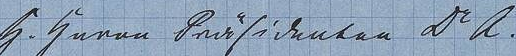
H. Herrn Präsidenten Dr A.
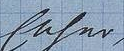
Escher,
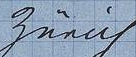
Zürich.
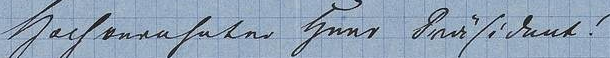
Hochverehrter Herr Präsident!
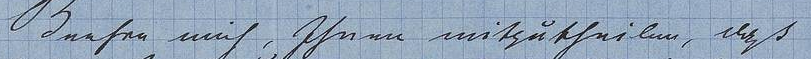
Beehre mich, Ihnen mitzutheilen, daß
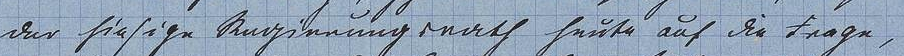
der hiesige Regierungsrath heute auf die Frage,
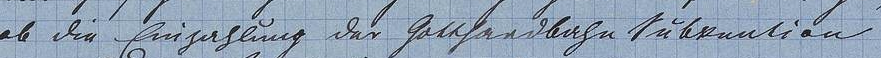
ob die Einzahlung der Gotthardbahn Subvention
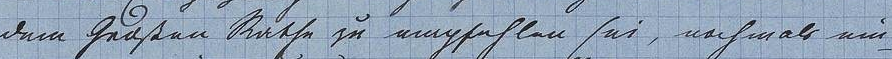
dem Großen Rathe zu empfehlen sei, nochmals ein-
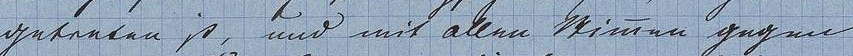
getreten ist, und mit allen Stimmen gegen
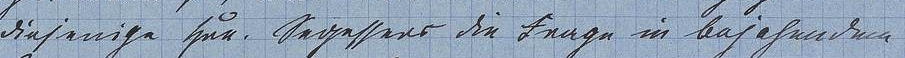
diejenige Hrn. Segessers die Frage im bejahendem
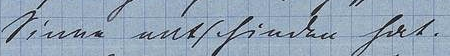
Sinne entschieden hat.
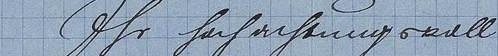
Ihr hochachtungsvoll
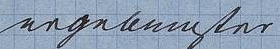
ergebenster
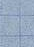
Dr
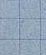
Joh
